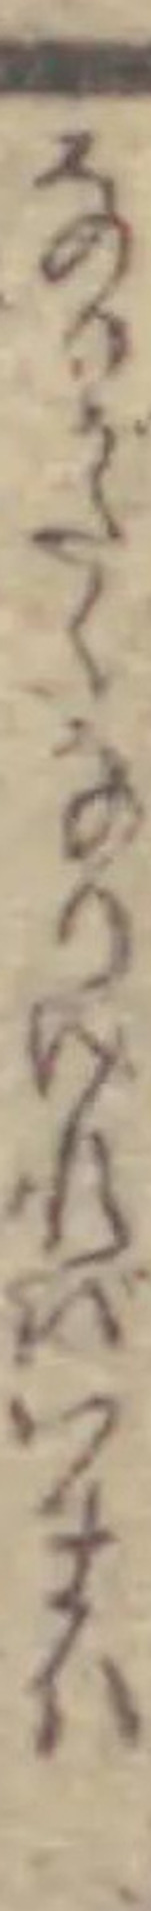なりがたくなりければいまは
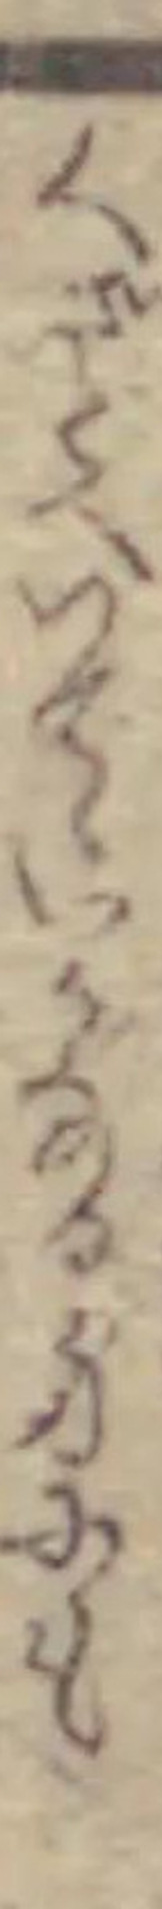人ざとへいでゝいかなる身にも
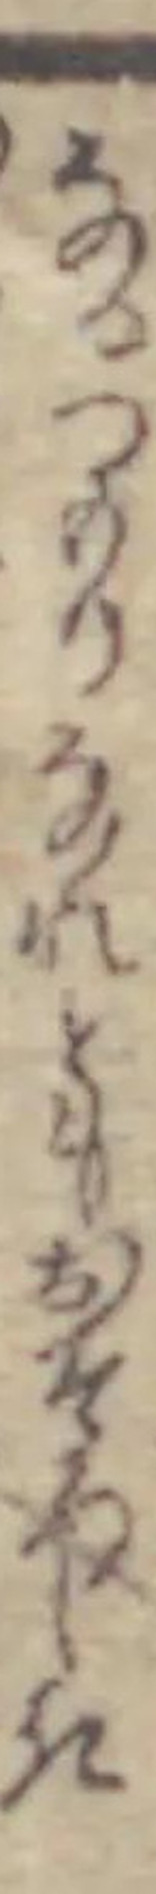なるつもりなれともおそろしき
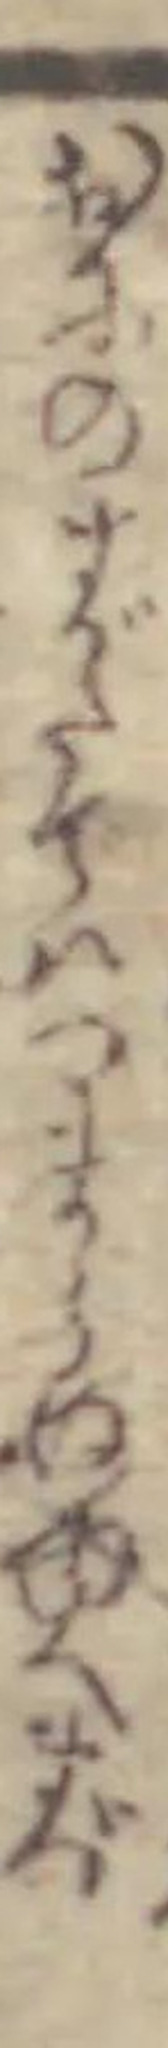おにのすがたてはつまらぬゆへまづ
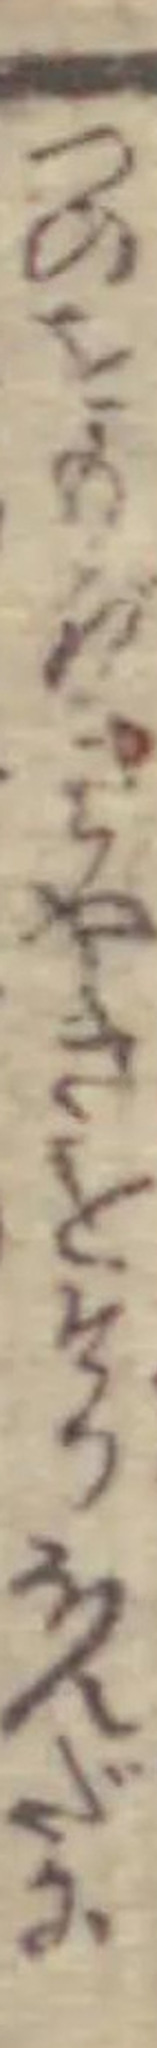つのをもぎさかやきをそりほんだに
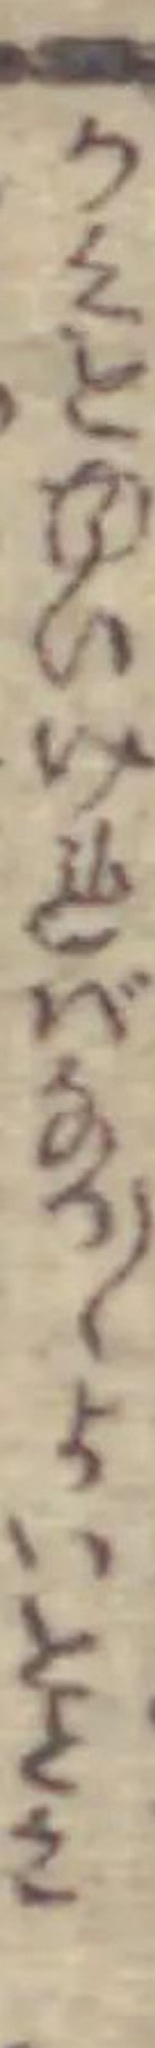かみをゆいければなか〳〵よいをとこ
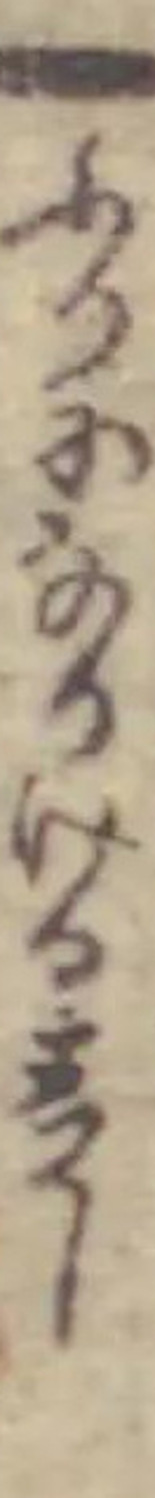ふりになりけるしかし
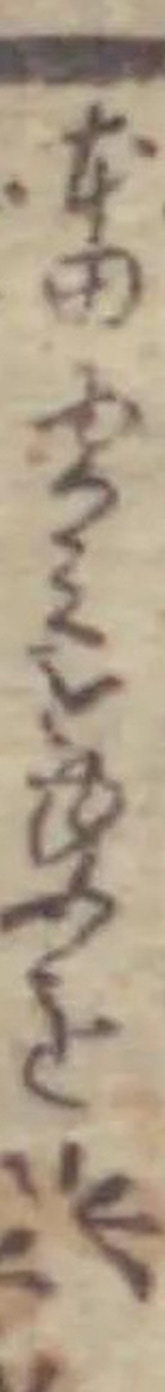本田にかみをゆふを
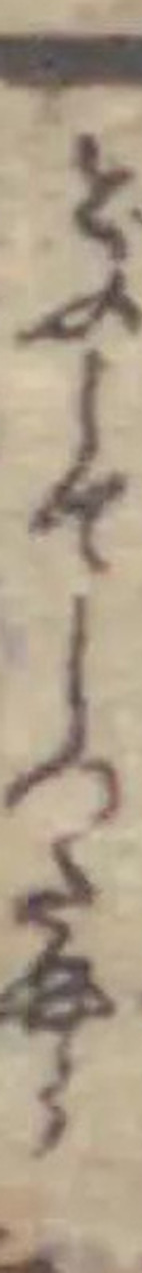どふしてしつたやら
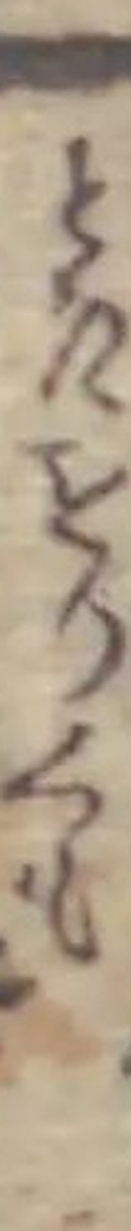ときをりくも

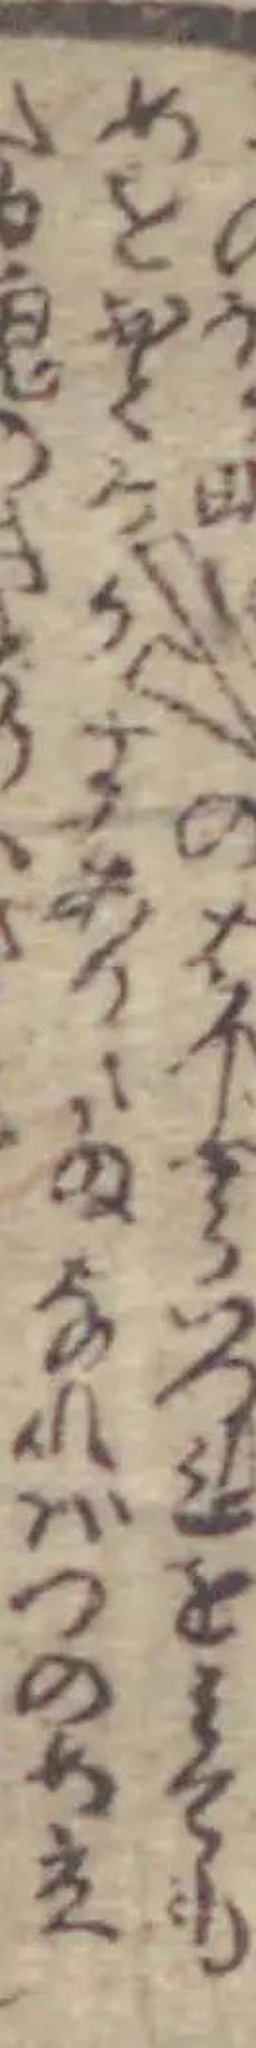めをおとろかすありさまなればつのめ立
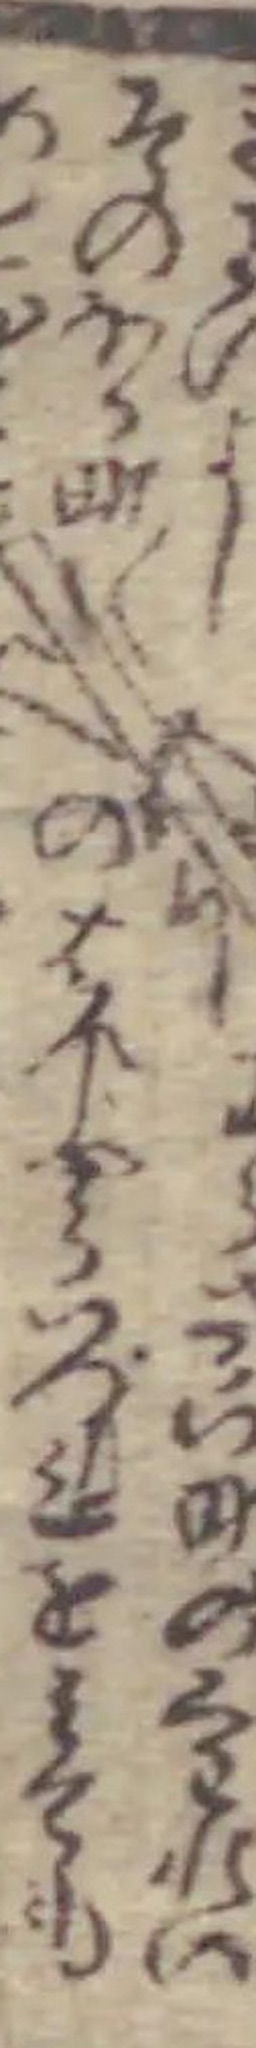そのほか町〳〵のはんじやういづれをみても
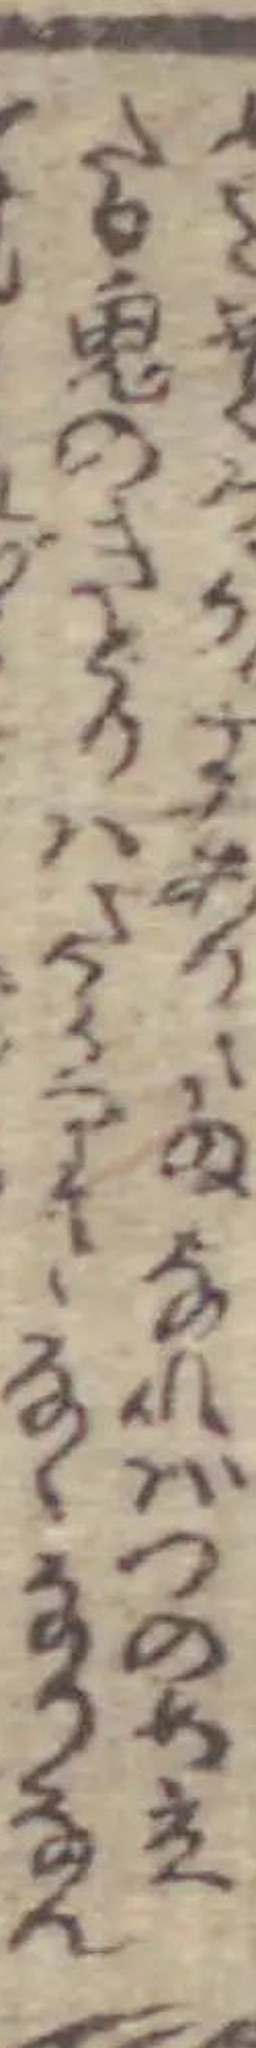たる鬼のきとりはさかりきなくなりなん
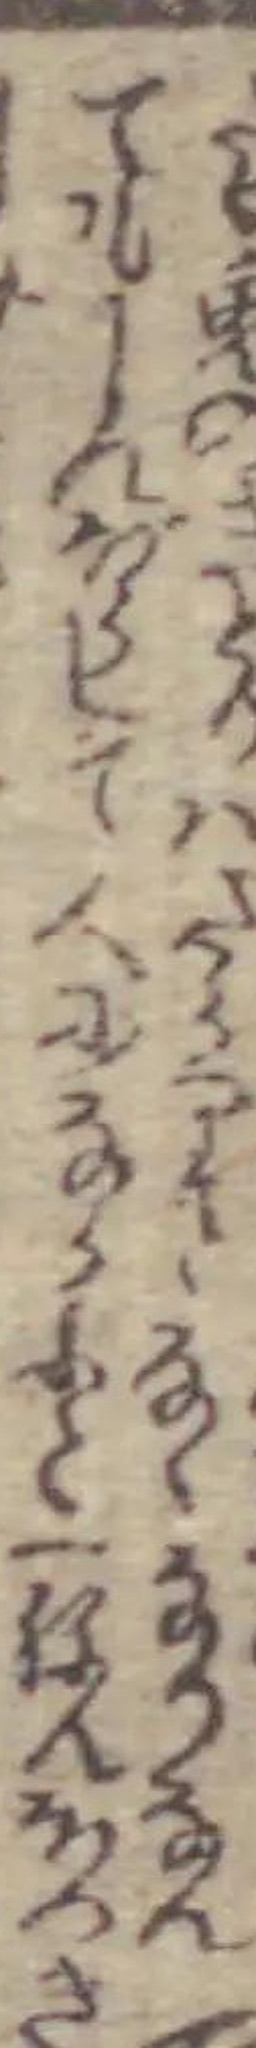てもしんぼうして人にならふと一ねんほつき
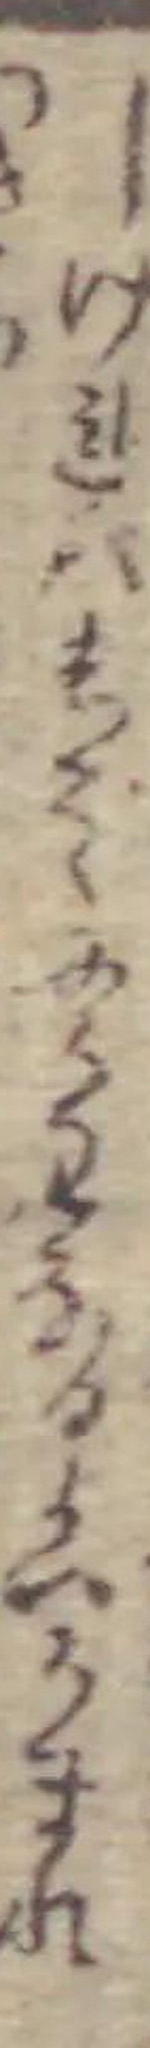しければしごくにかわなるよいうまれ
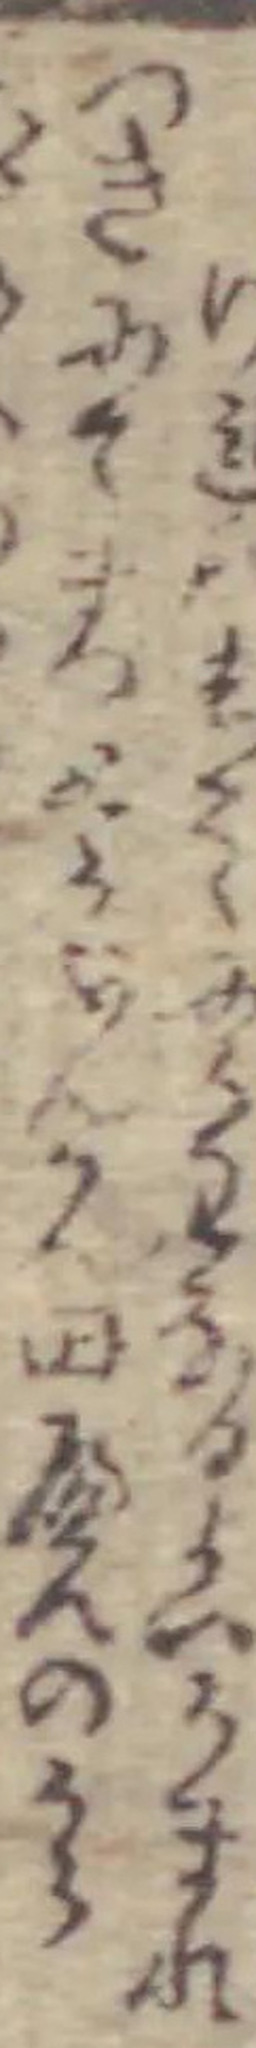つきにてまつとうぶんかん田へんのうら
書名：鬼子宝 3巻
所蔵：国立国会図書館 National Diet Library, JAPAN
